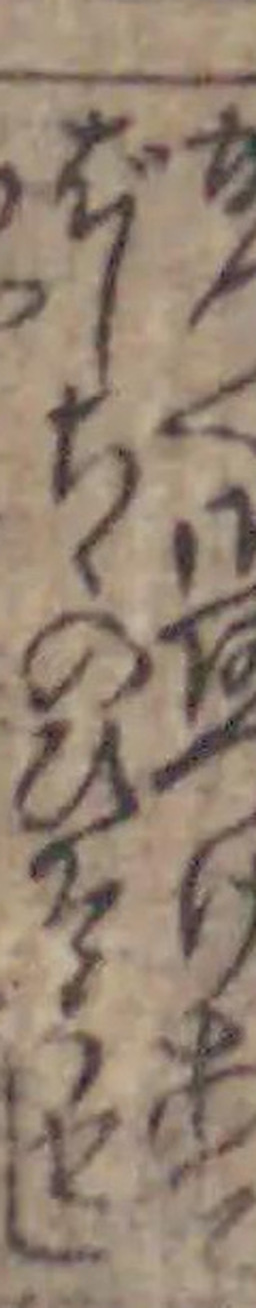ばしちゝのひそうせし
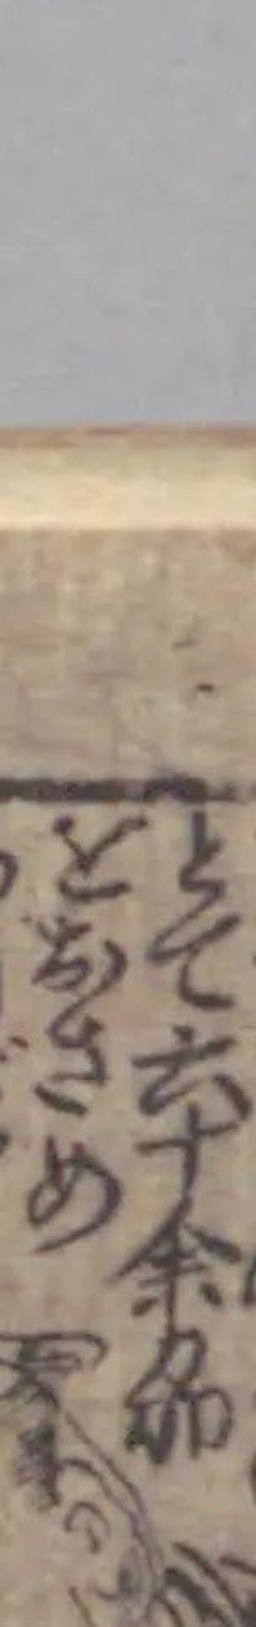をおさめ
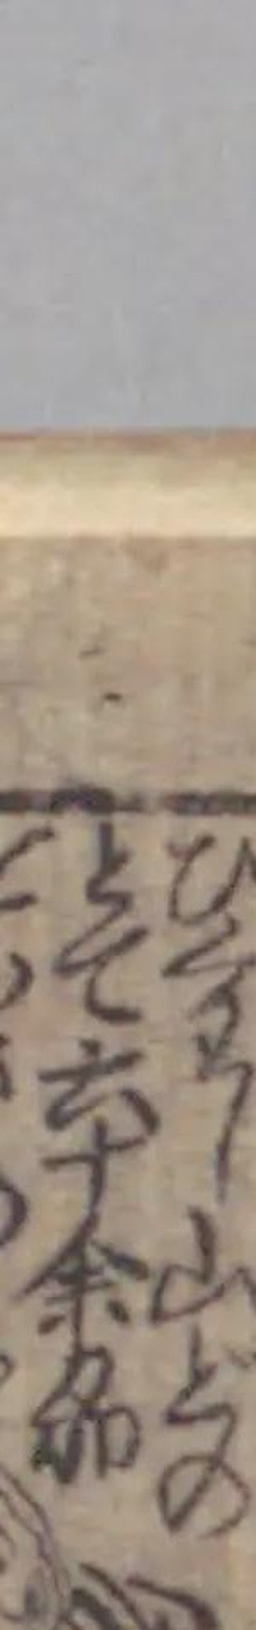とて六十余州
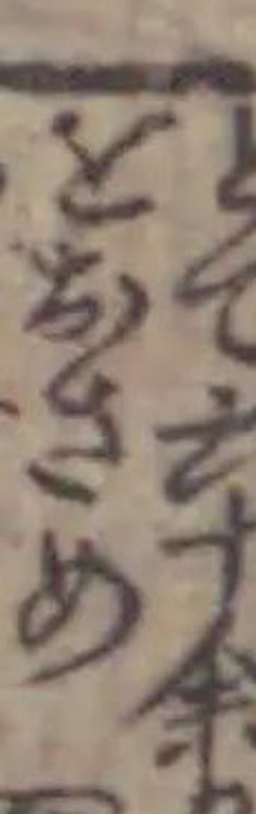をおさめ
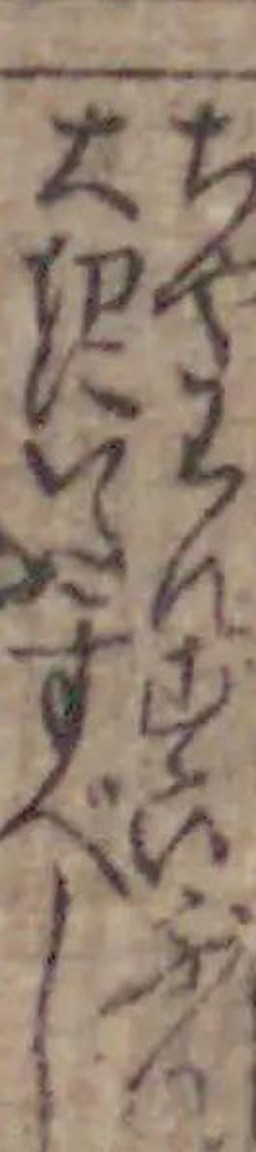大切にいたすべし
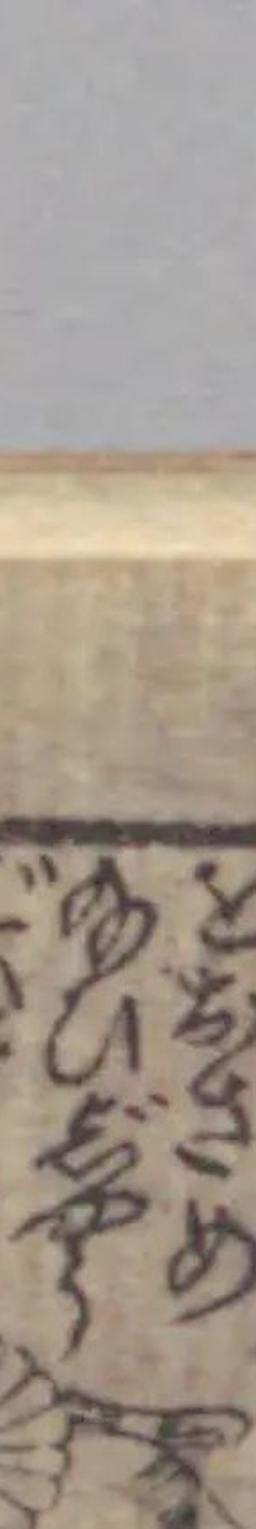給ひじやう
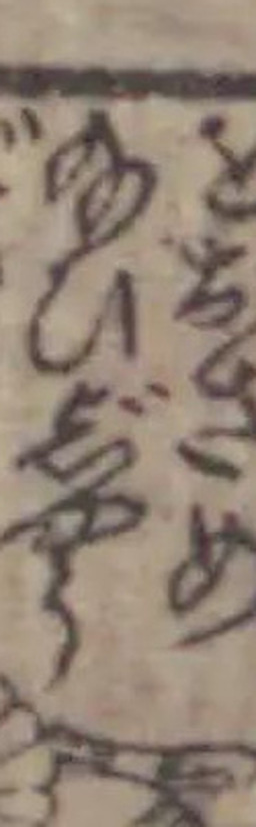給ひじやう
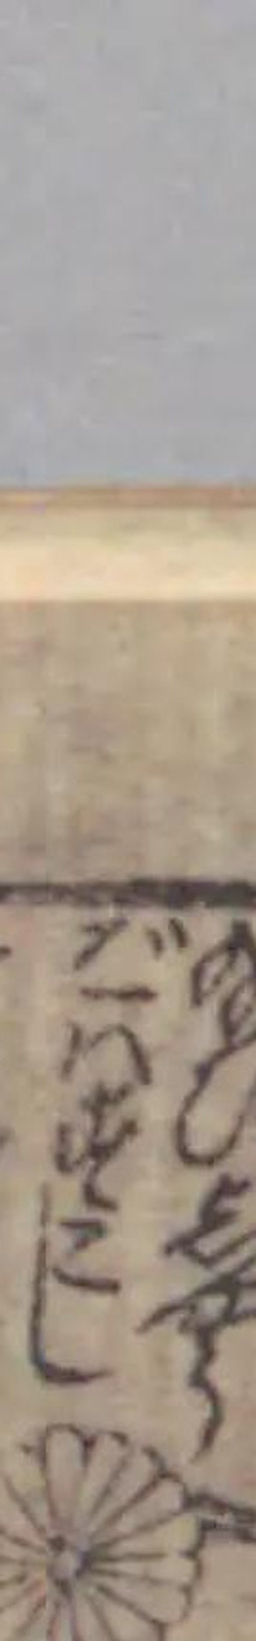ごはすこし
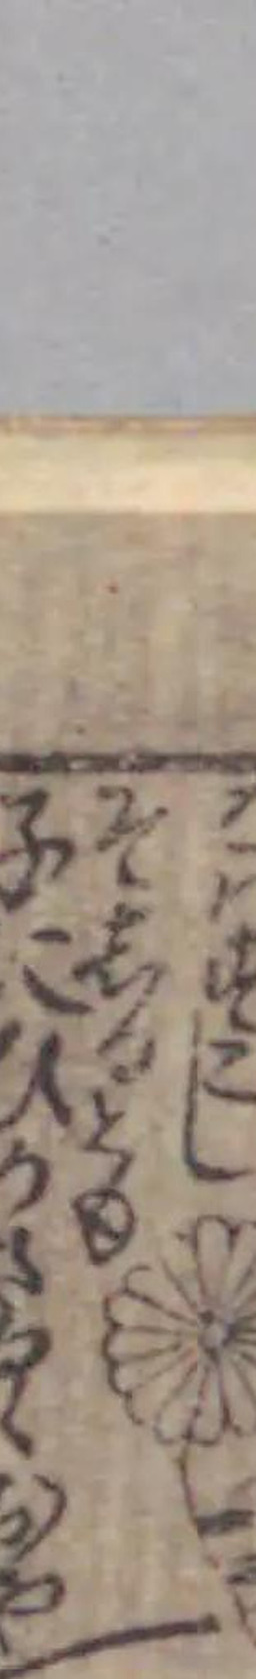そしるとも
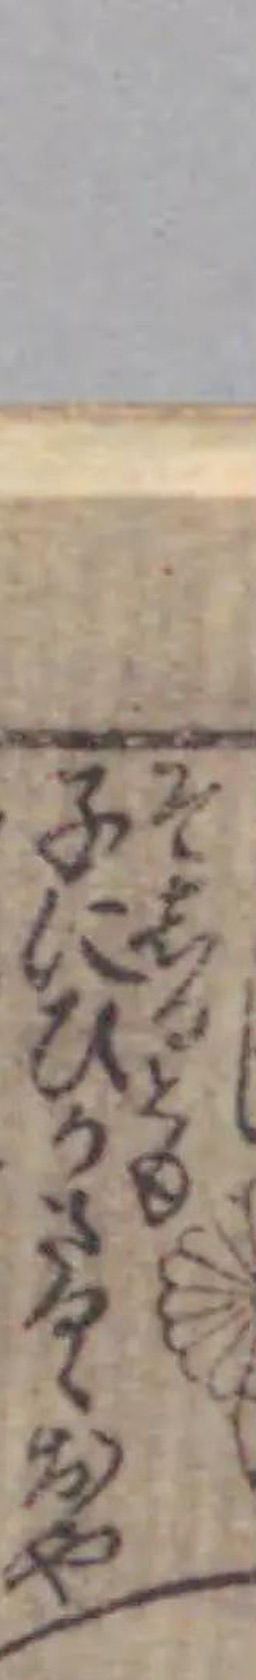子にひかさるゝおや
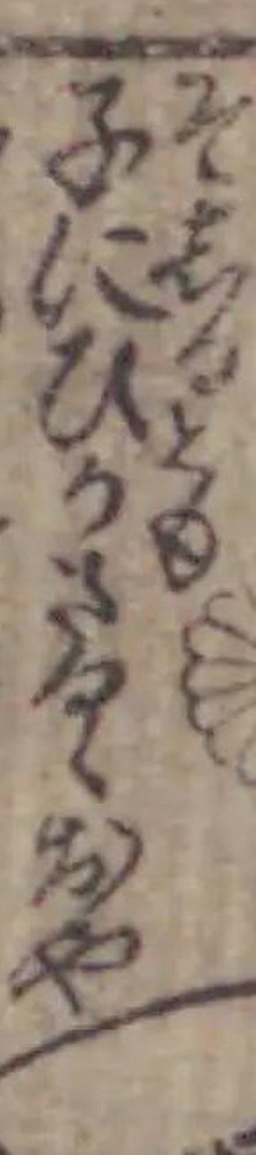子にひかさるゝおや
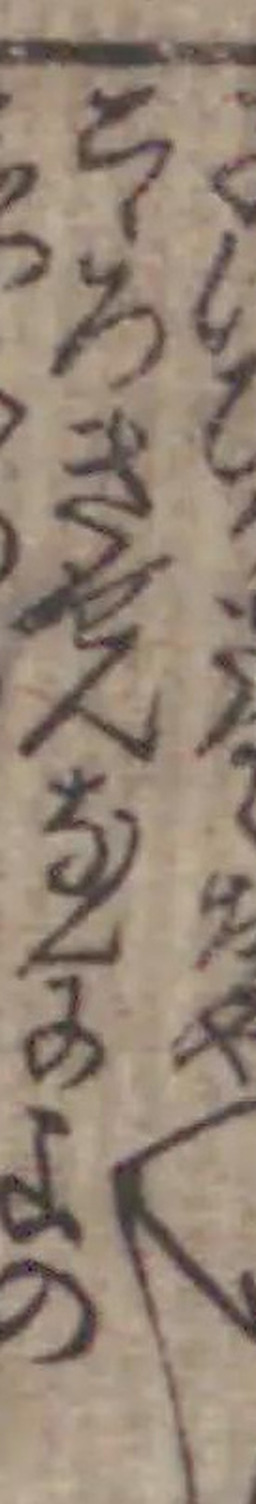こゝろきせんなんによの
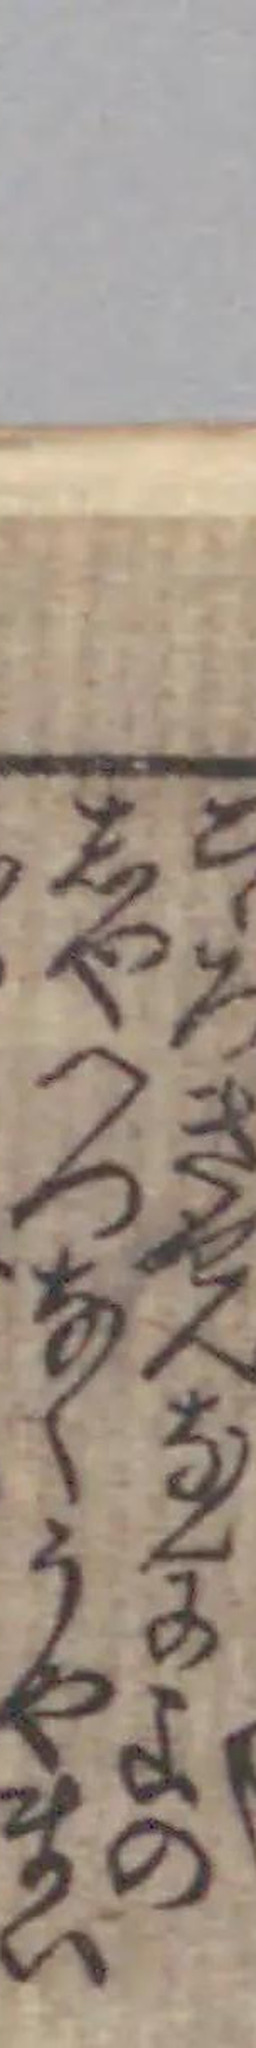しやへつなくうやまい
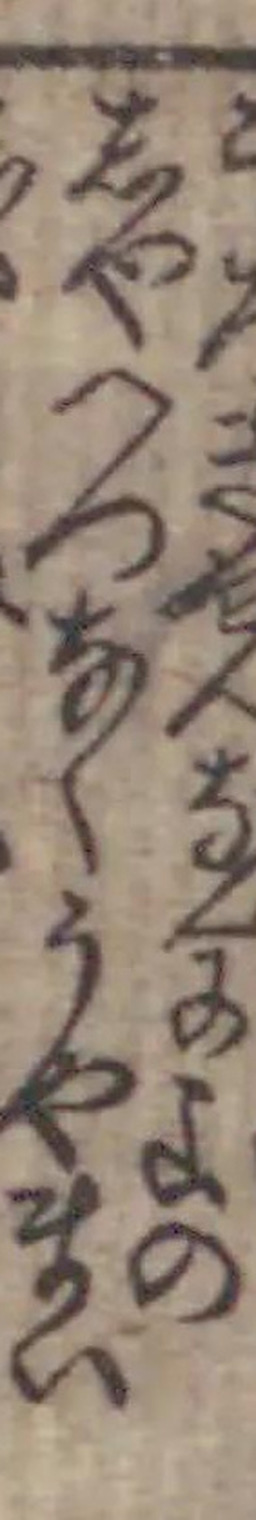しやへつなくうやまい
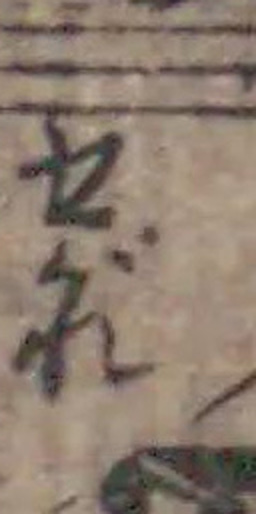せがれ
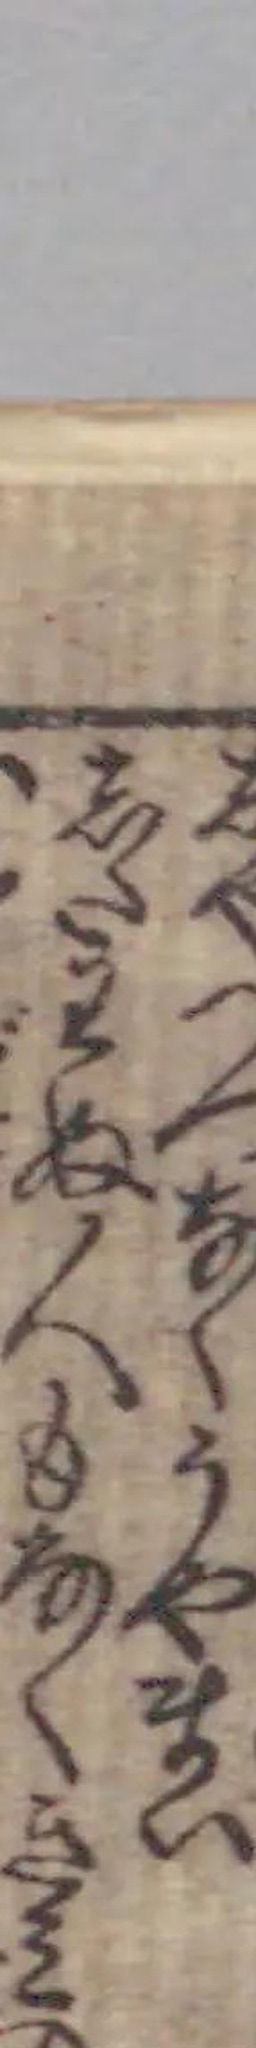したわぬ人もなくきみの
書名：名代干菓子山殿 3巻
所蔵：国立国会図書館 National Diet Library, JAPAN
